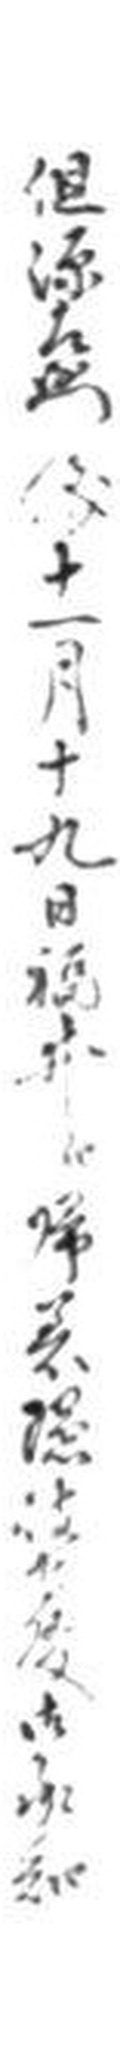但源左衛門儀十一月十九日福井江帰着隠岐守殿御承知
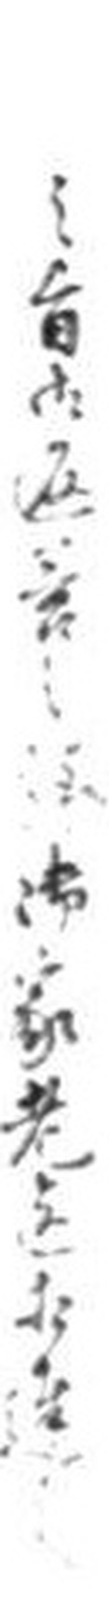之旨御返答之趣御家老迄相達之
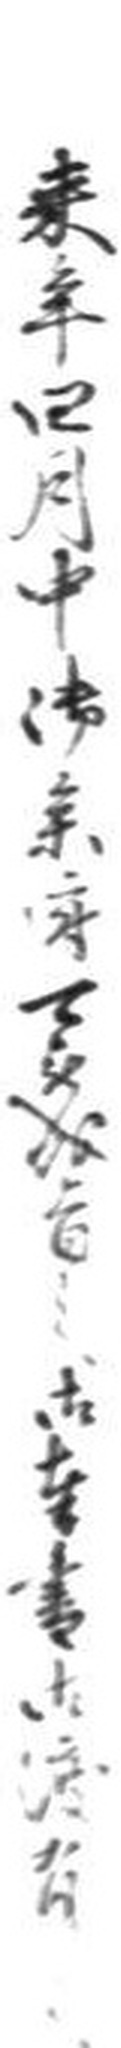来年四月中御参府可被成旨之御奉書御渡有之
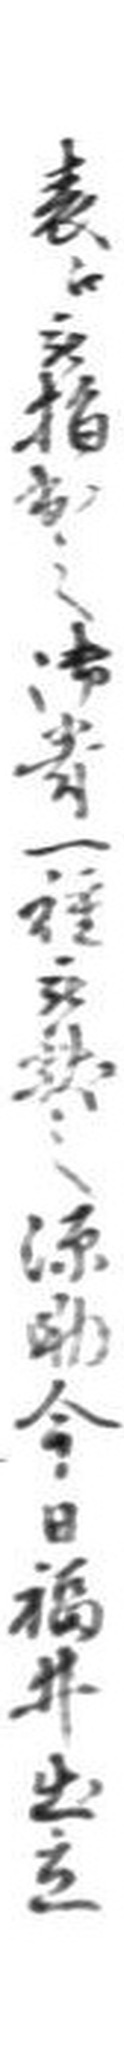表江被指出之御肴一種被献之源助今日福井出立
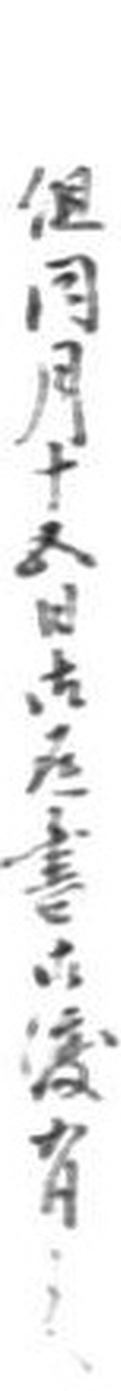但同月十五日御返書御渡有之
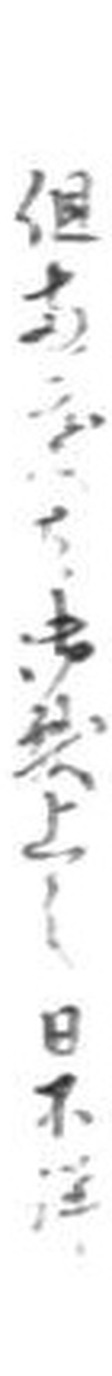但両度共御献上之日不詳

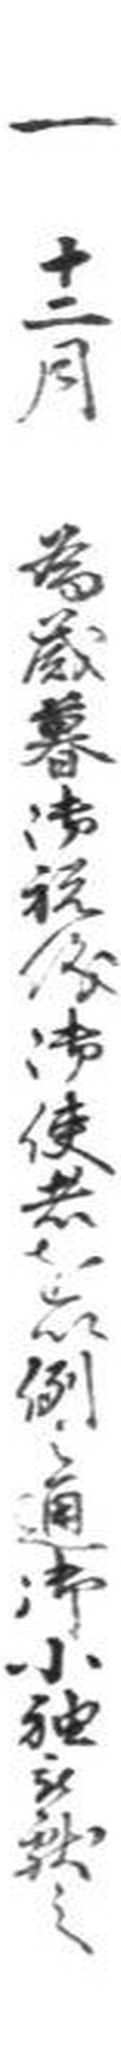一十二月為歳暮御祝儀御使者を以例之通御小袖被献之
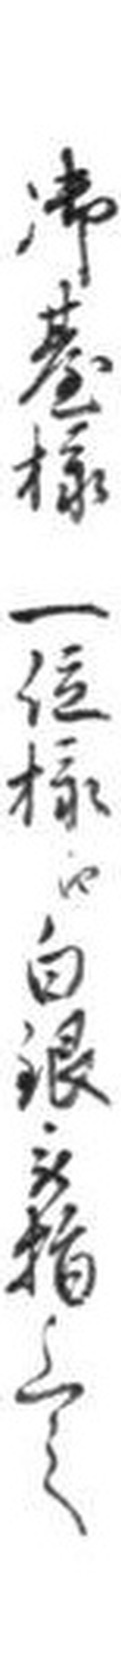御台様一位様江白銀被指上之
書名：家譜 二十二 吉品公 従元禄十五年到同十六年
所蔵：福井県文書館 Fukui Prefectural Archives
